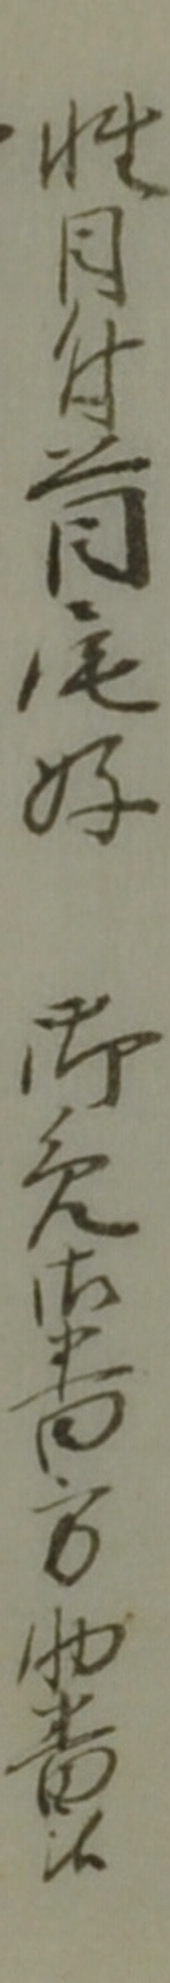姓目付首尾好御免御番方助番被
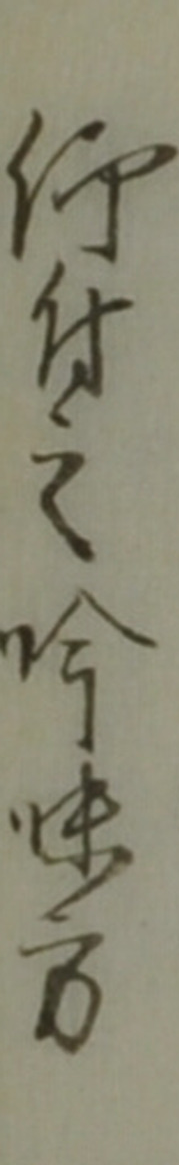仰付之吟味方
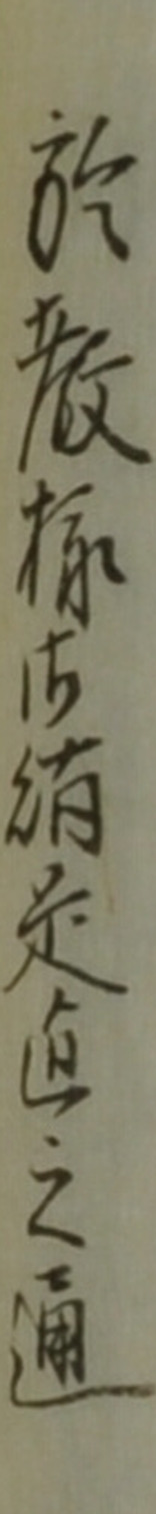於教様御賄是迄之通
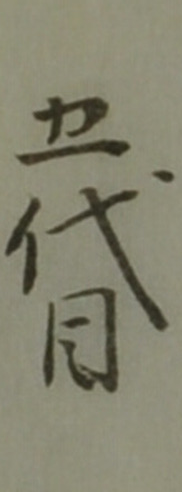五代目
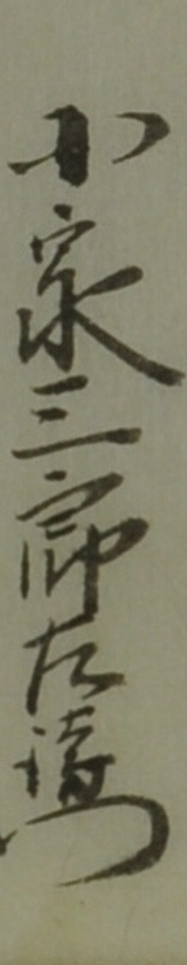小家三郎左衛門
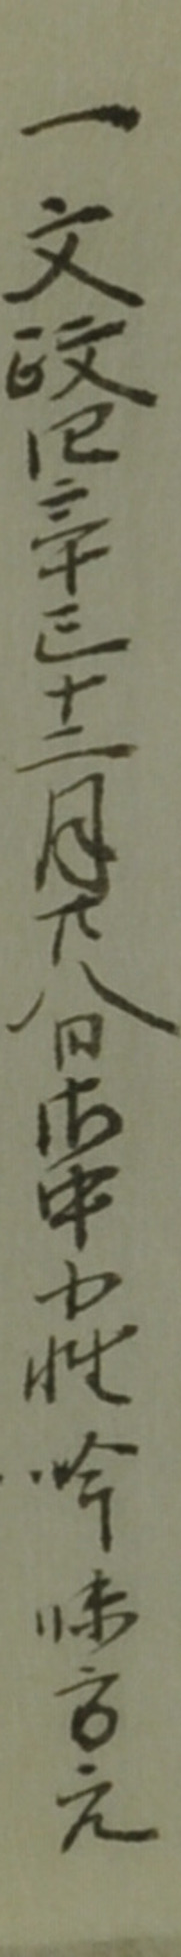一文政四辛巳十二月廿八日御中小姓吟味方元
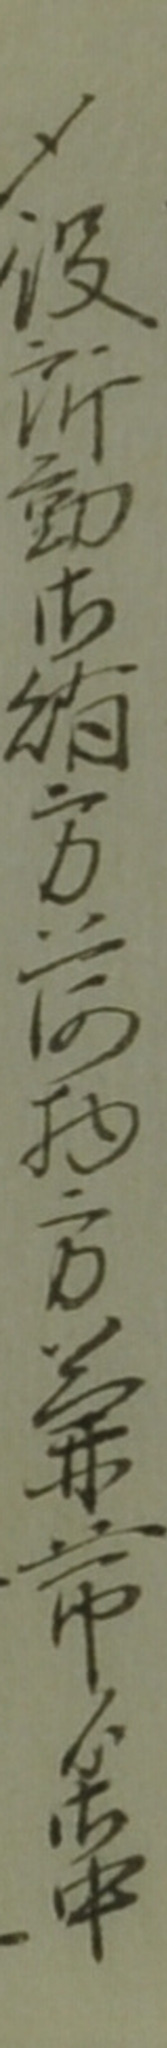〆役所勤御賄方荷物方兼帯より御中
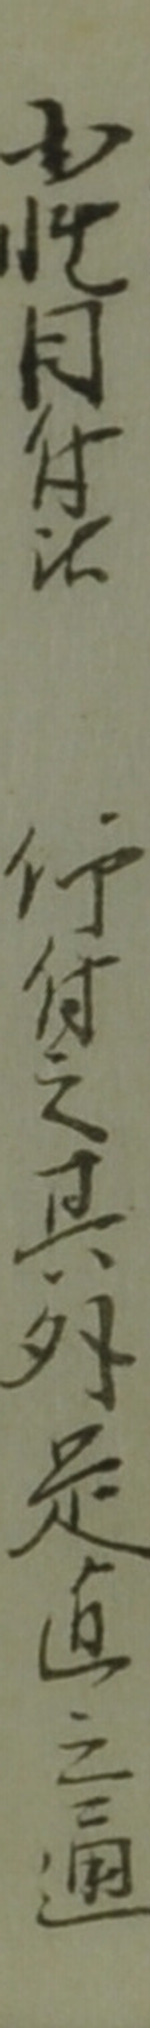小姓目付被仰付之其外是迄之通
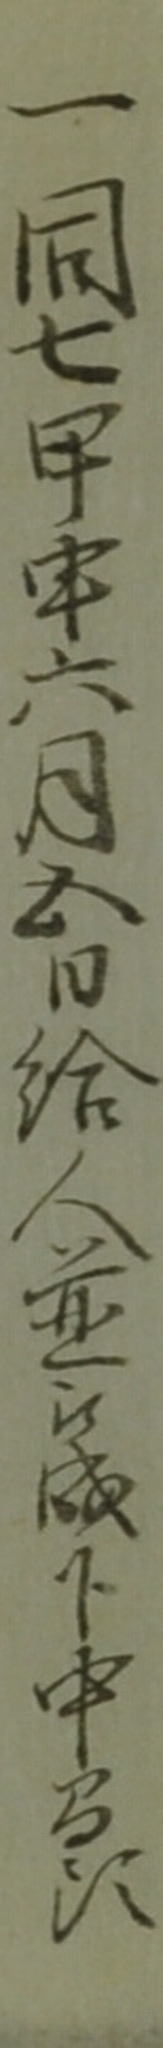一同七甲申六月五日給人並被成下中間頭
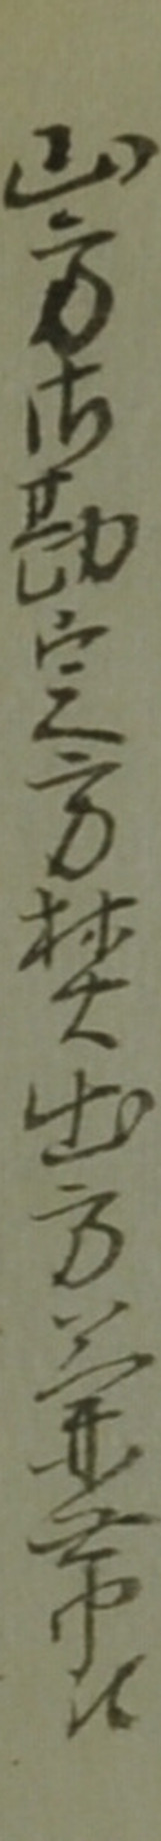山方御勘定方焚出方兼帯被
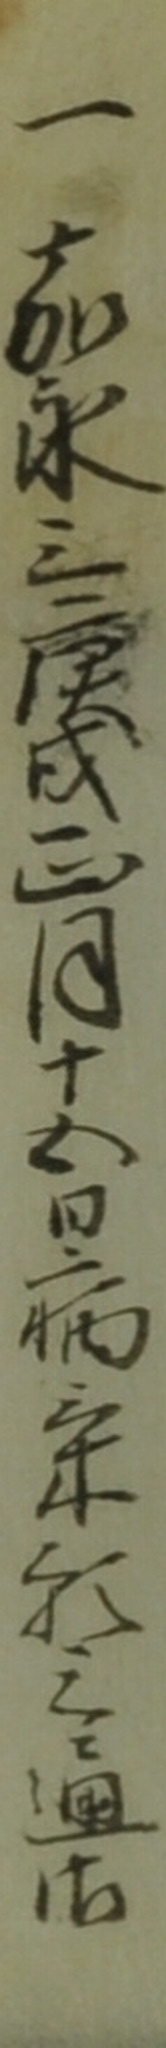一嘉永三庚戌正月十五日病気願之通り御
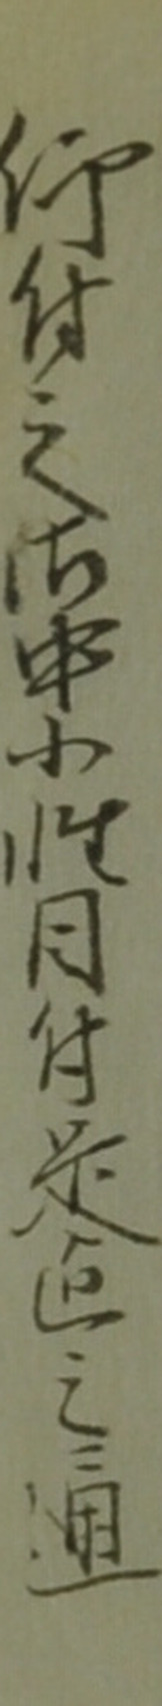仰付之御中小姓目付是迄之通
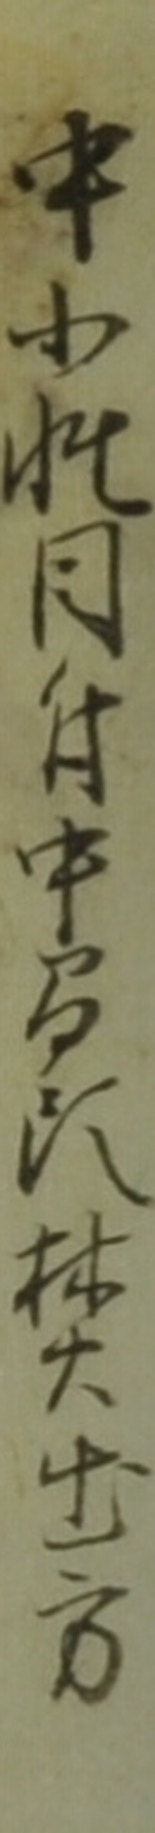中小姓目付中間頭焚出方

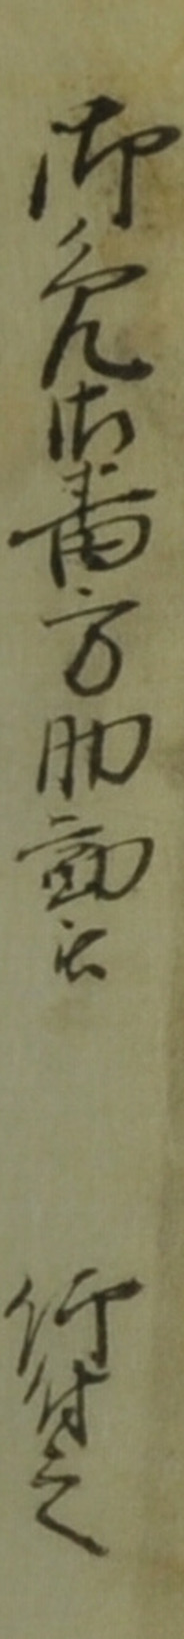御免御番方助勤被仰付之
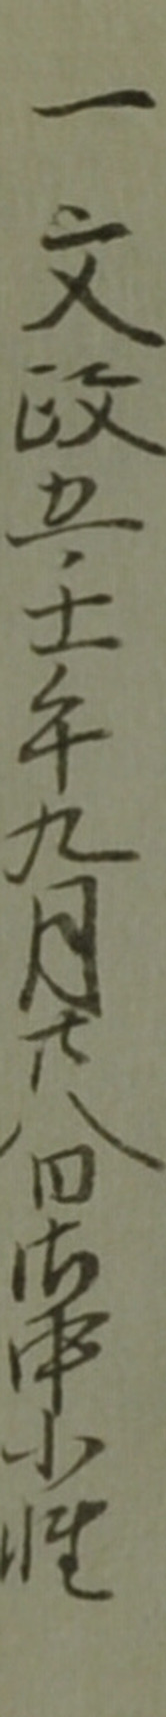一文政五壬午九月廿八日御中小姓
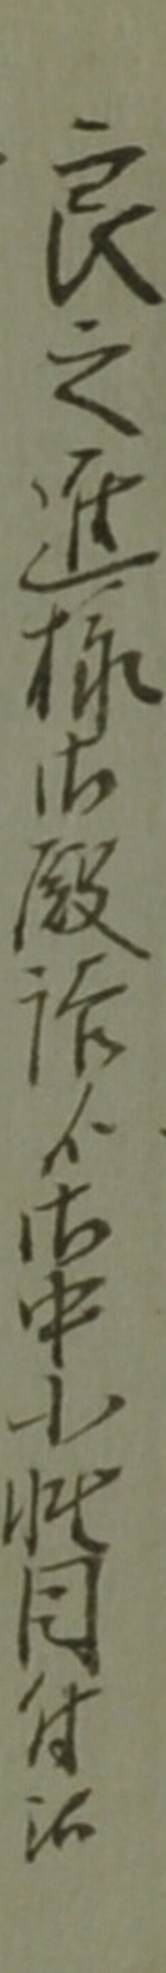良之進様御殿詰より御中小姓目付被
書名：諸御役代々録（八）
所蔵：伊那市立高遠町図書館・合同会社AMANE
